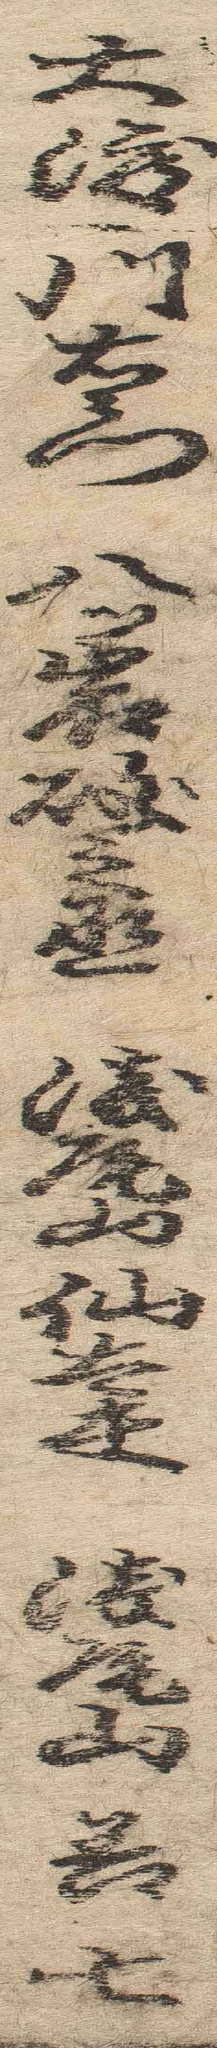大渡門右衛門八ッ岩磯之丞浅尾山仙太夫浅尾山善七
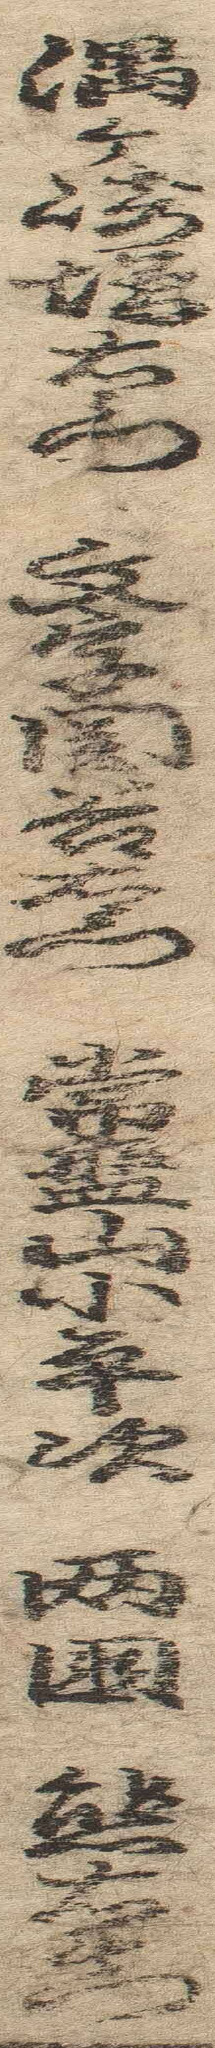隅ケ崎増右衛門文字関谷右衛門常盤山小平次両國熊右衛門
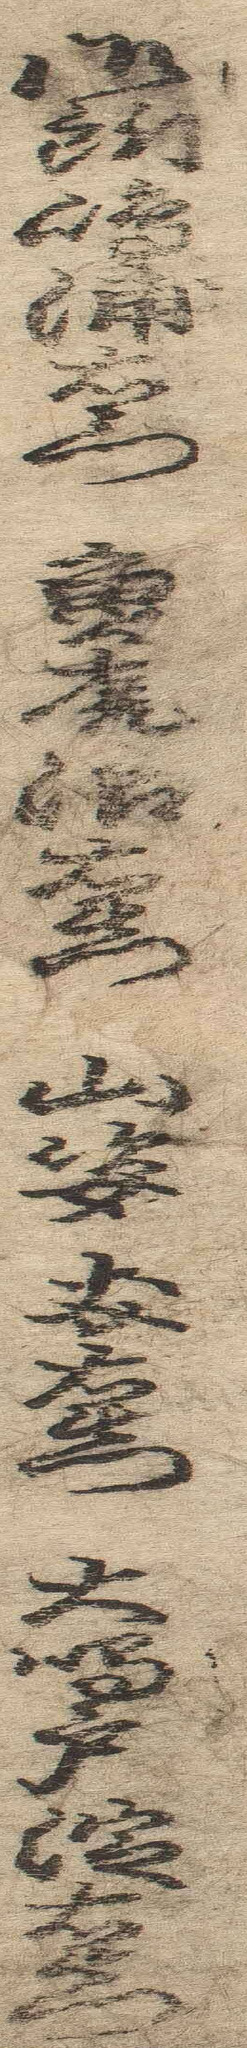御所嶋浦右衛門魚虎浪右衛門山姿森右衛門大鳴門浜右衛門
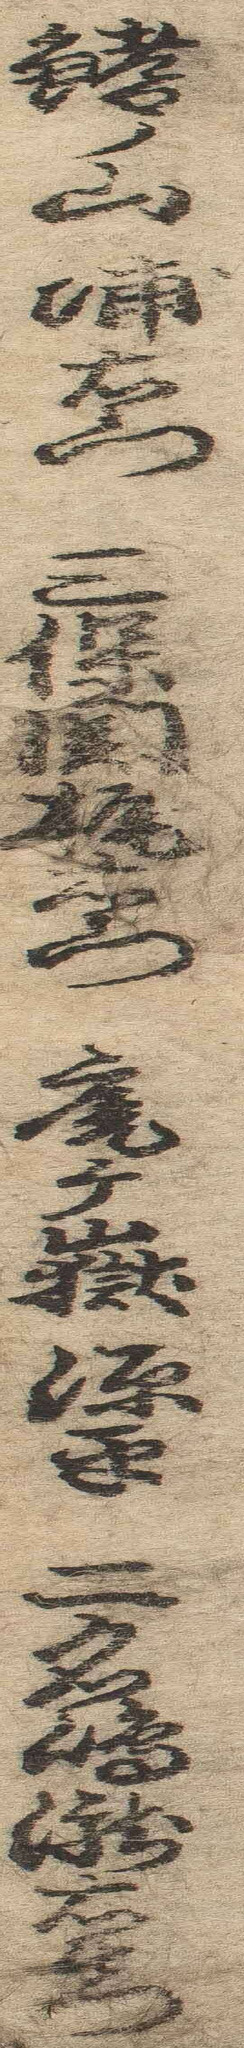鮱ノ山浦右衛門三條関梶右衛門鹿ケ嶽源平二名嶋瀧右衛門
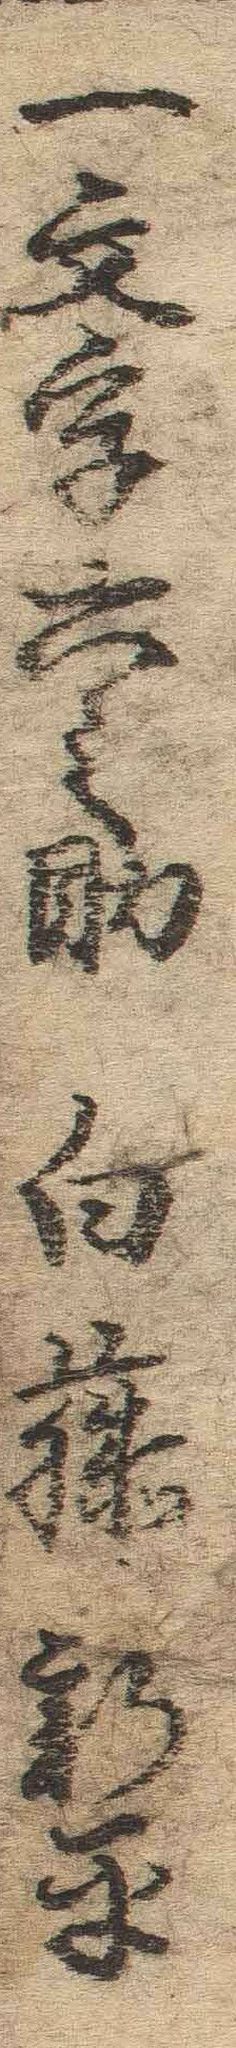一文字六之助白藤新平

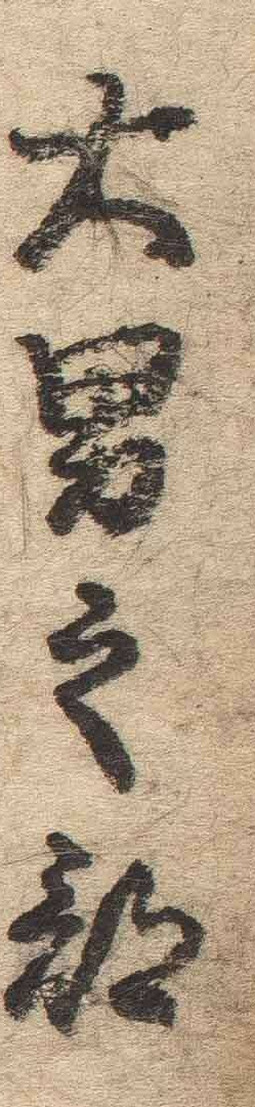大男之部
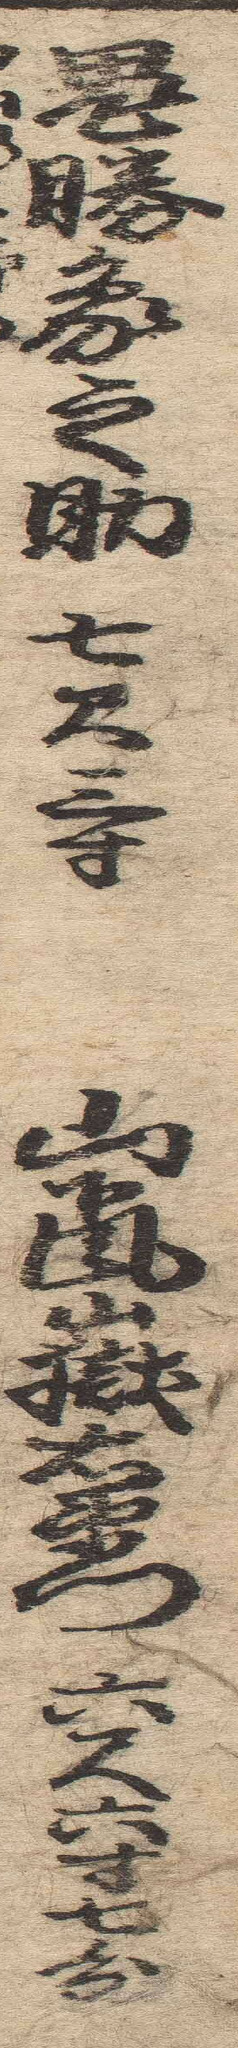鬼勝象之助七尺三寸山嵐嶽右衛門六尺六寸七分
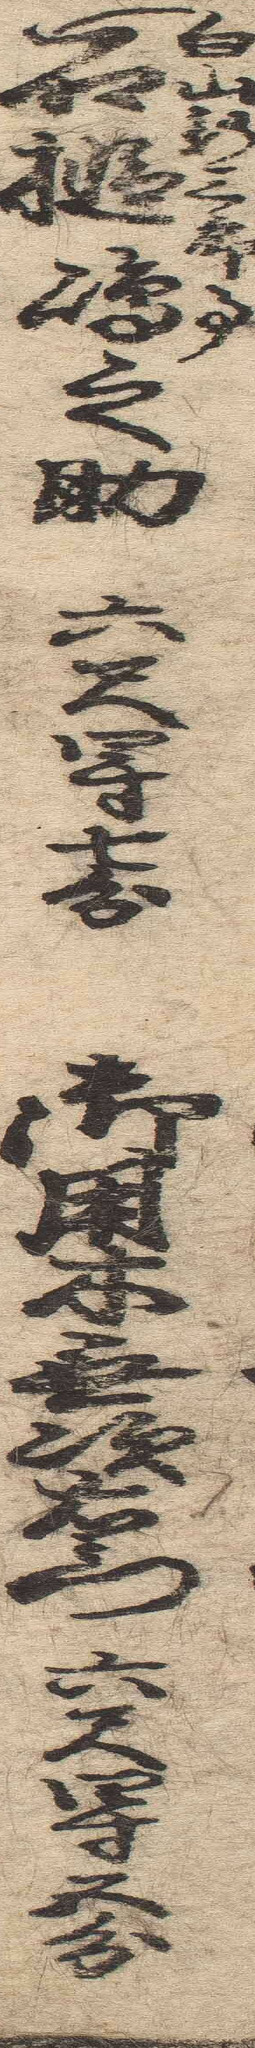石槌嶋之助六尺四寸三分御用木無次右衛門六尺四寸五分
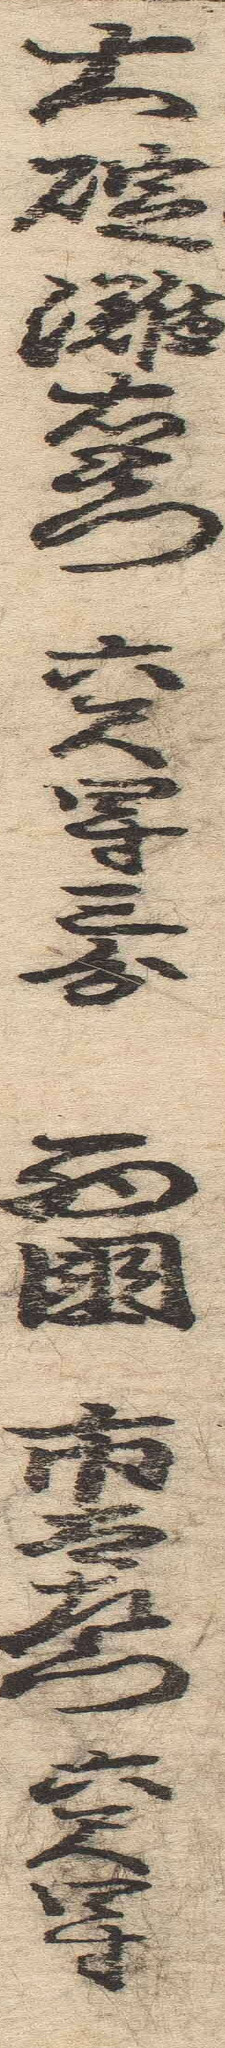大碇灘右衛門六尺四寸三分両国市太左衛門六尺四寸
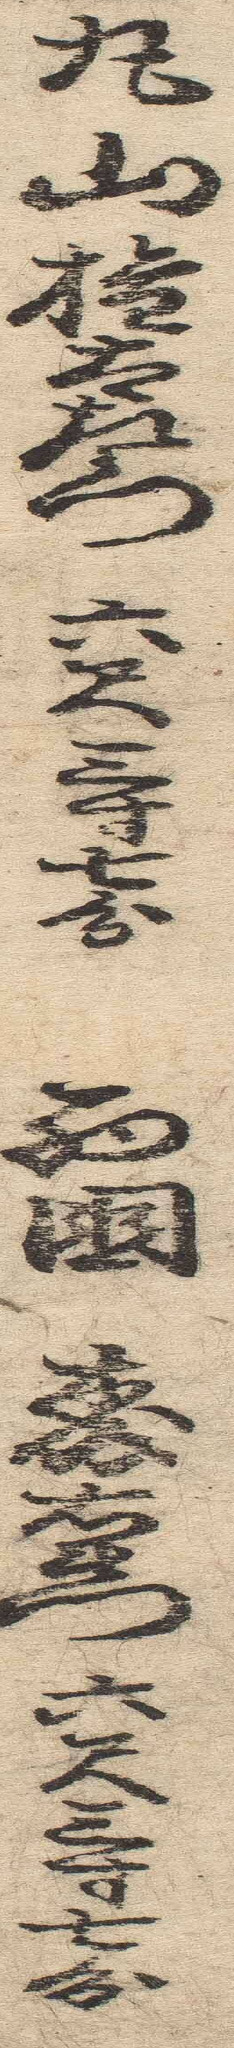丸山権太左衛門六尺三寸七分両国森右衛門六尺三寸七分
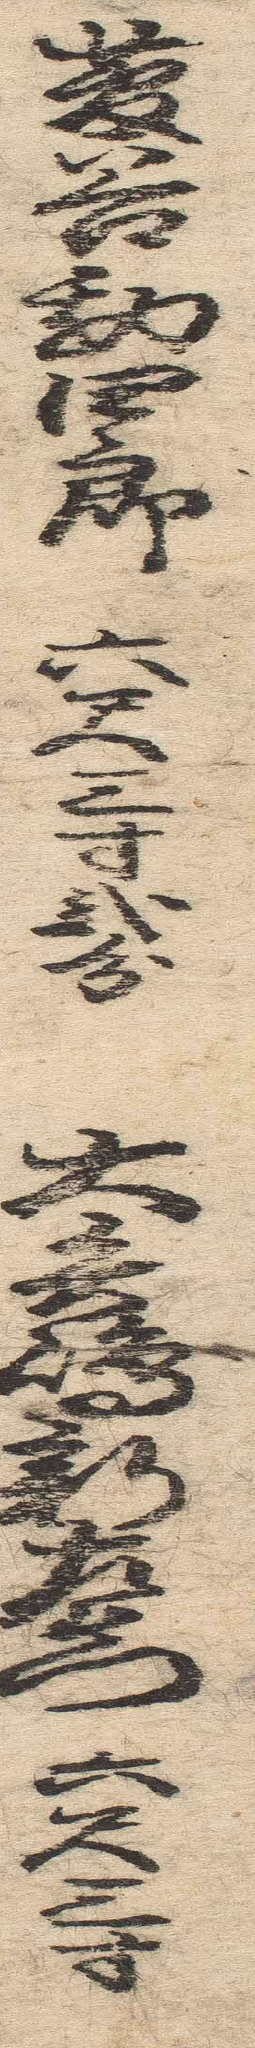管谷勘四郎六尺三寸弐分大矢嶋新右衛門六尺三寸
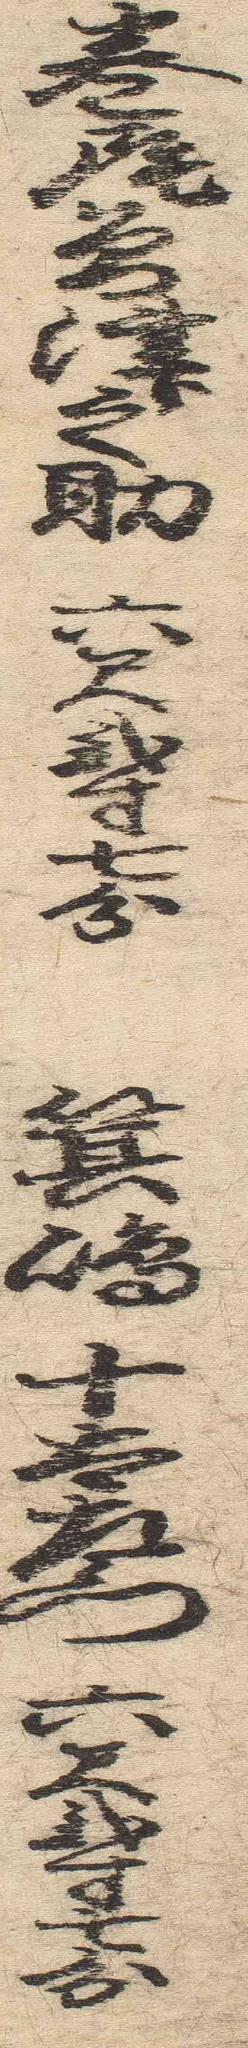巻尾曽津之助六尺弐寸七分箕嶋十太左衛門六尺弐寸七分
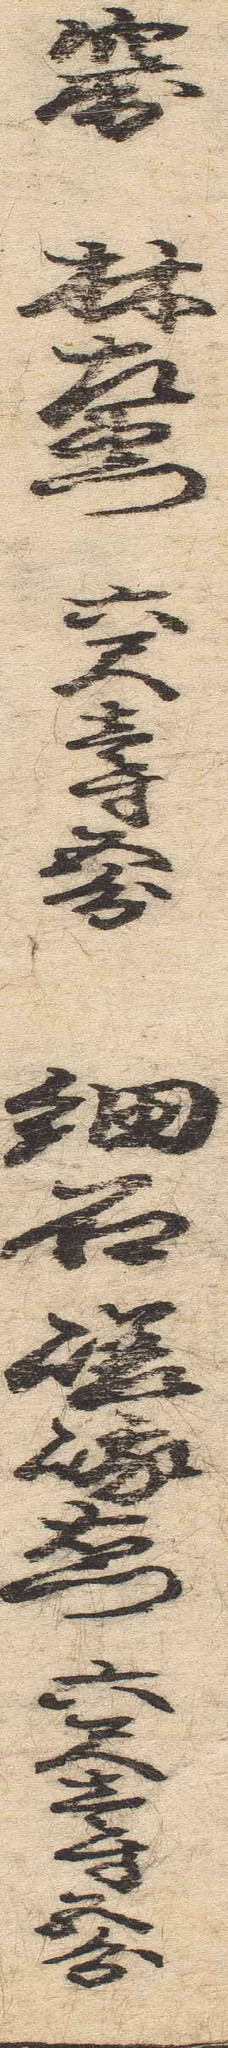窟林左衛門六尺壱寸五分細石嵯峨右衛門六尺壱寸五分
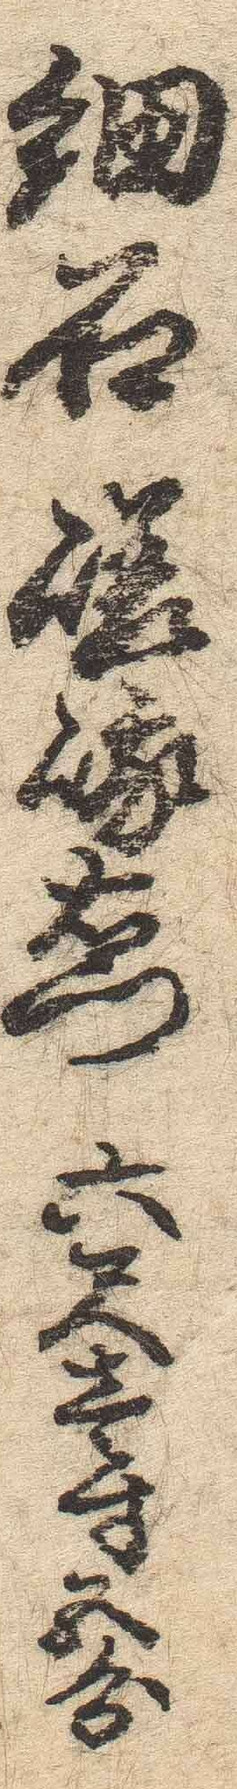吉野川団右衛門六尺弐寸五分
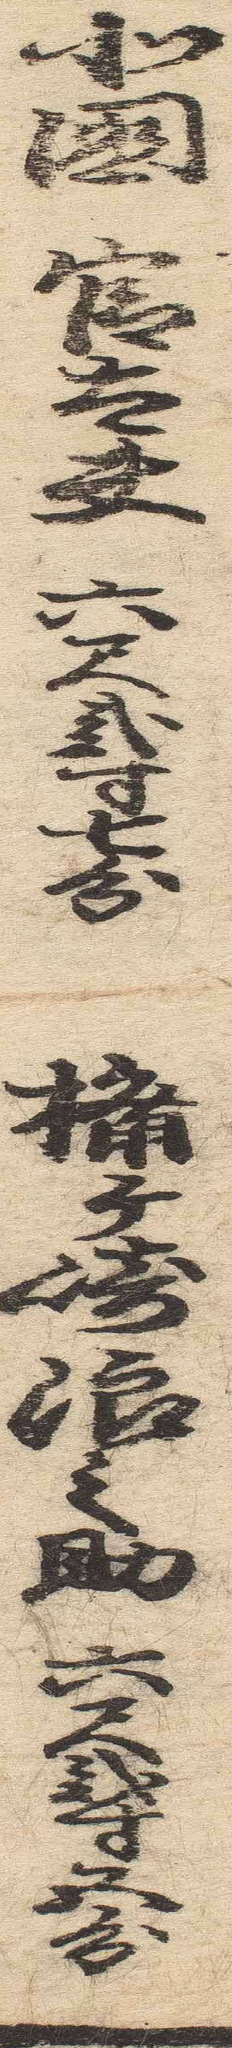北国官太夫六尺弐寸七分楯ケ崎浪之助六尺弐寸五分
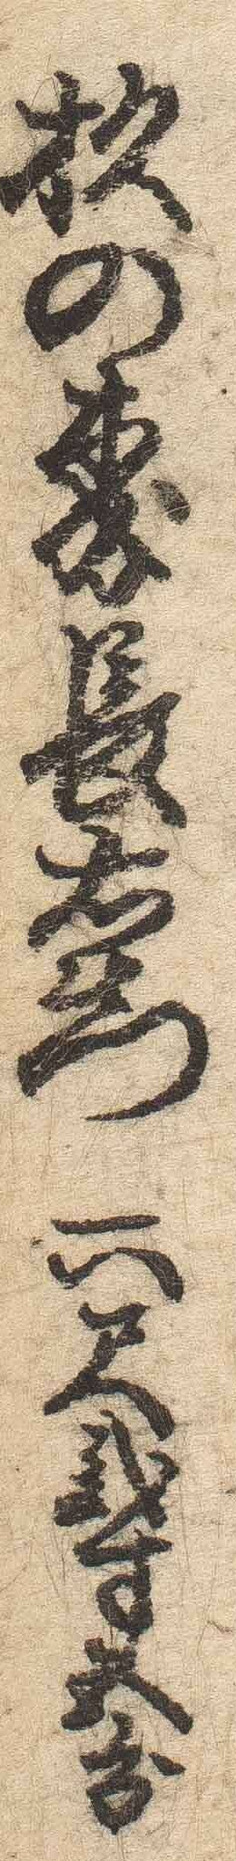吉野川団右衛門六尺弐寸五分
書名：古今相撲大全
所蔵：東京学芸大学附属図書館 国文学研究資料館
